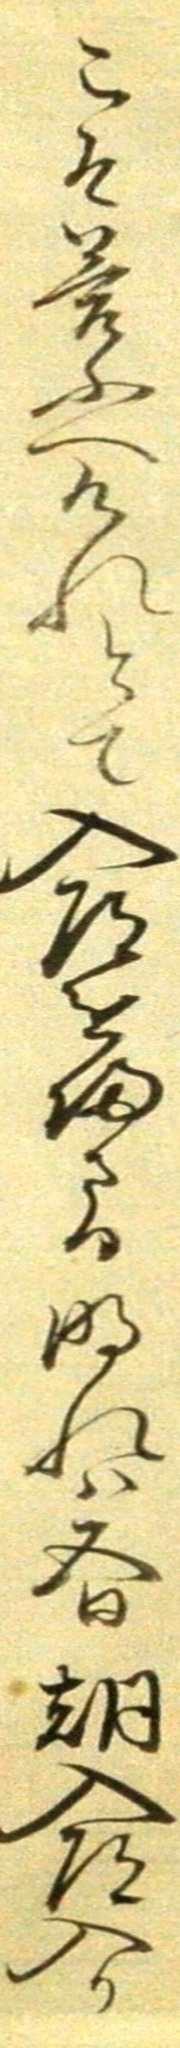こそ答ふへけれとて入道を帰さる明れは五日朝入道入り
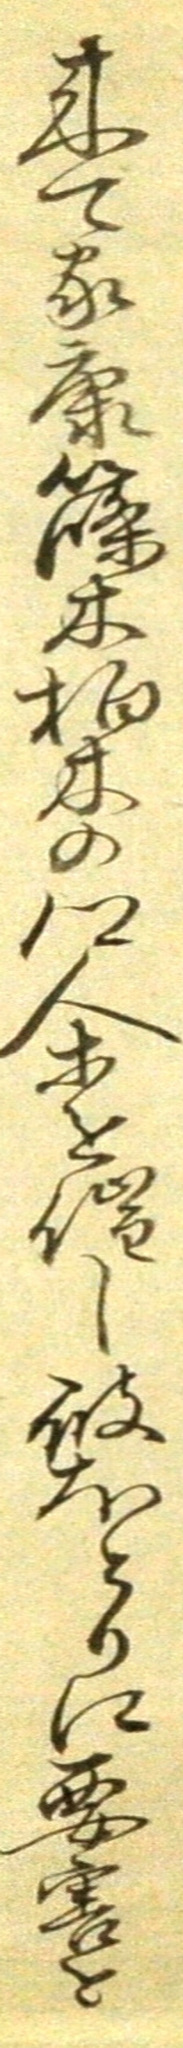来て家康篠木柏木の郷人等を催し彼ほとりに要害を
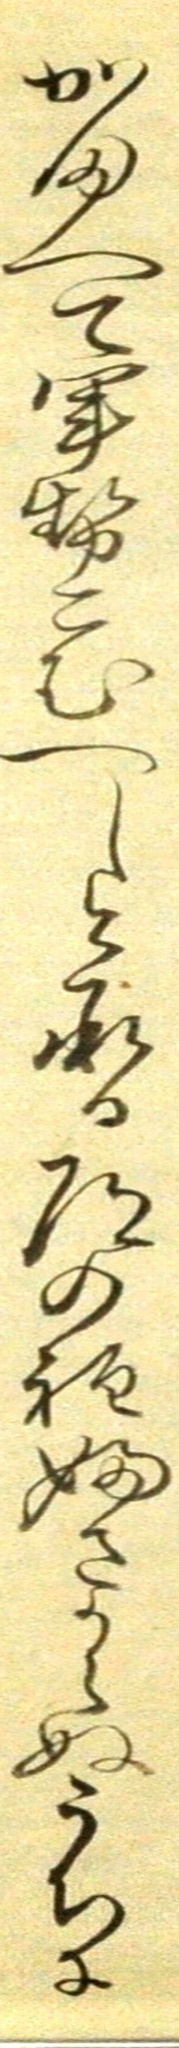かまへて軍勢こむへしと承る道の程ふさからぬうちに
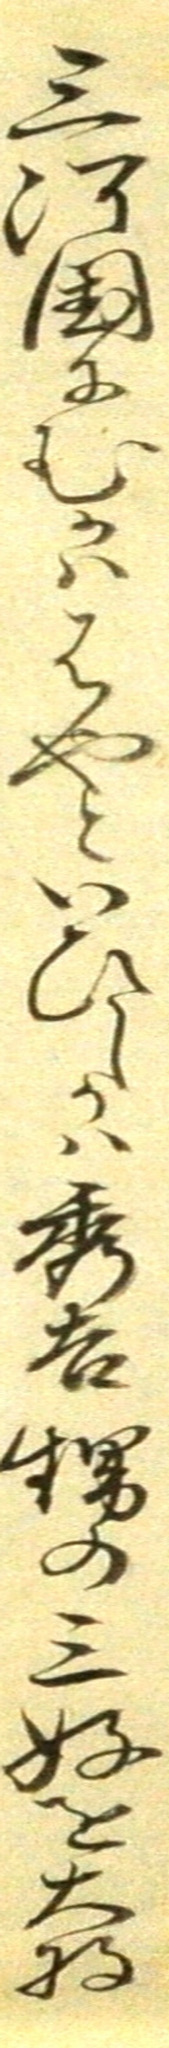三河国にむかははやといひしかは秀吉甥の三好を大将
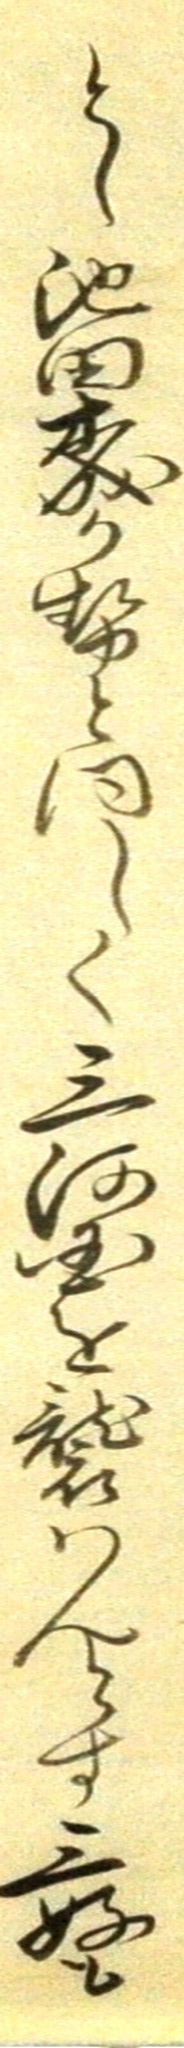とし池田森か勢と同しく三河国を襲はんとす三好も
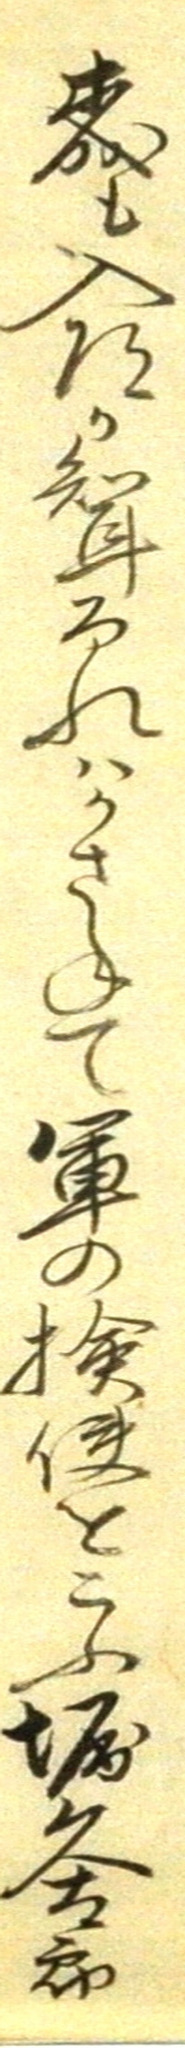森も入道か聟なれはかさねて軍の検使をこふ堀久太郎
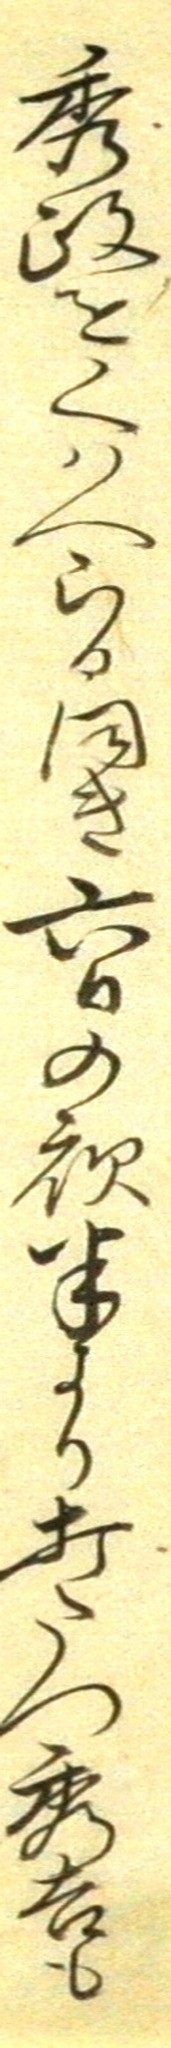秀政をくはへらる同き六日の夜半より打たつ秀吉も
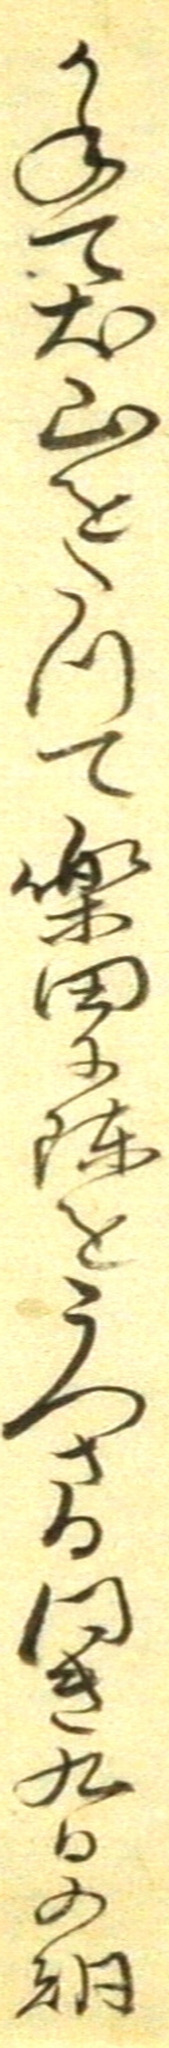かねて犬山をたつて楽田に陣をうつさる同き九日の朝
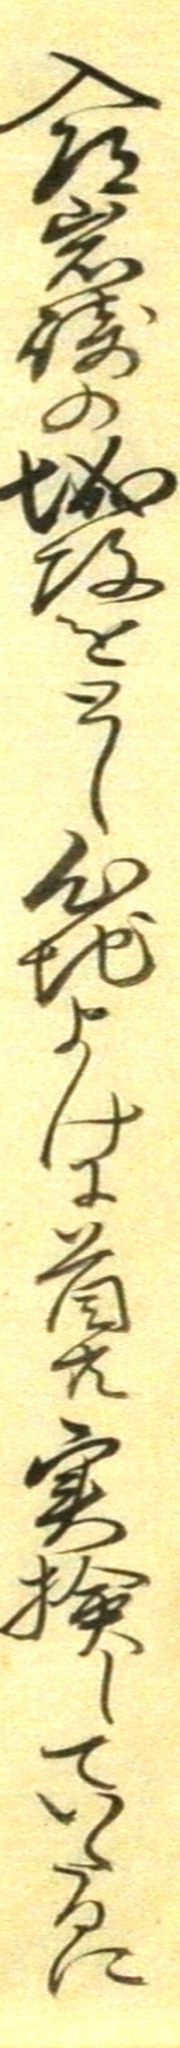入道岩崎の城攻をとし心地よけに首共実検していたるに
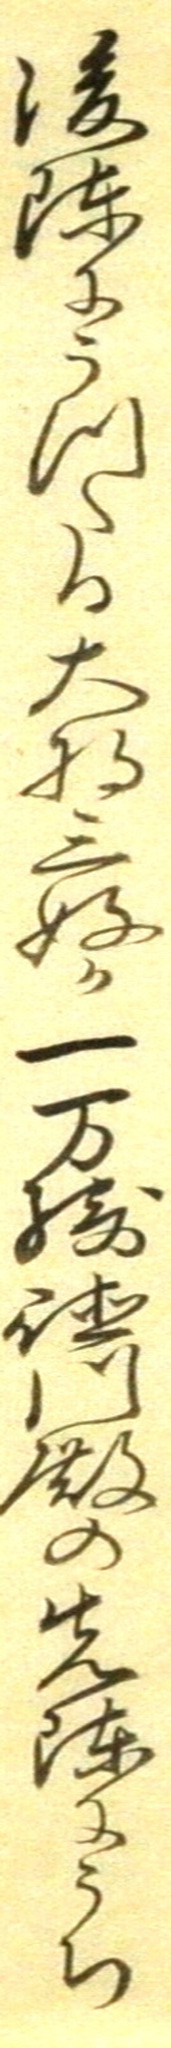後陣にうつたる大将三好か一万騎徳川殿の先陣にうち
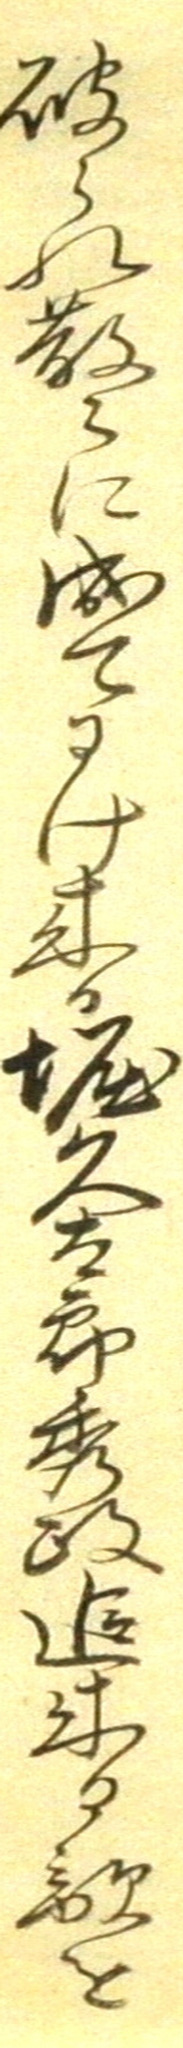破られ散々に成てにけ来る堀久太郎秀政追来る敵を
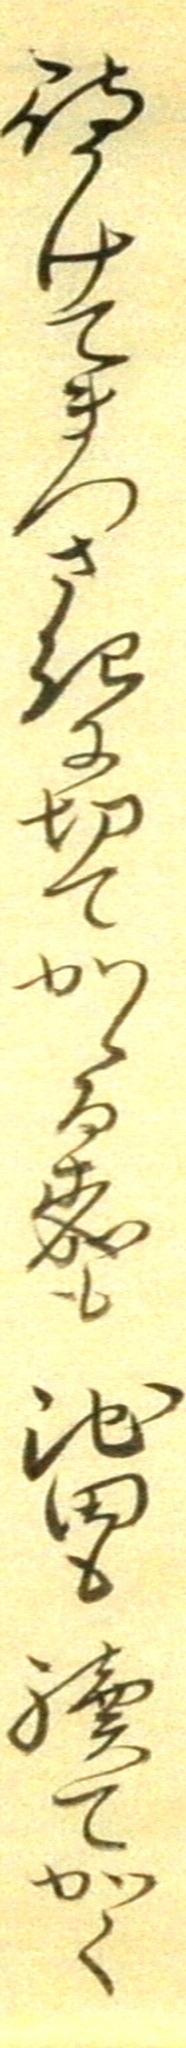待かけてまつさきに切てかゝる森も池田も続てかく
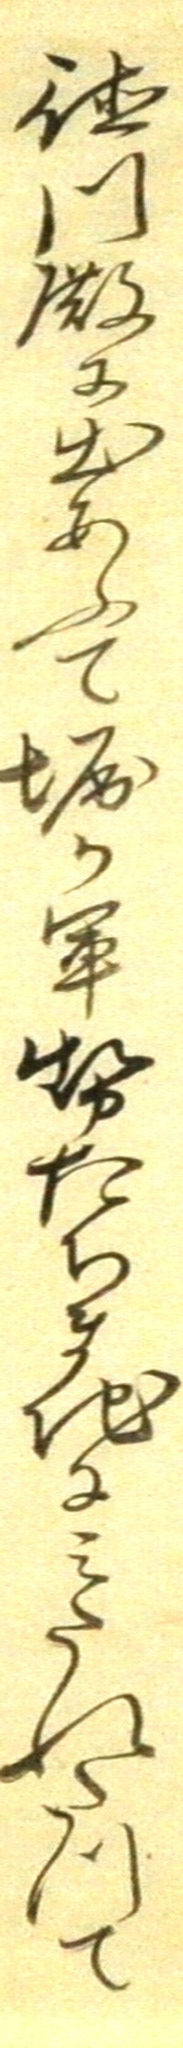徳川殿に出あふて堀か軍勢たちまちにみたれたつて
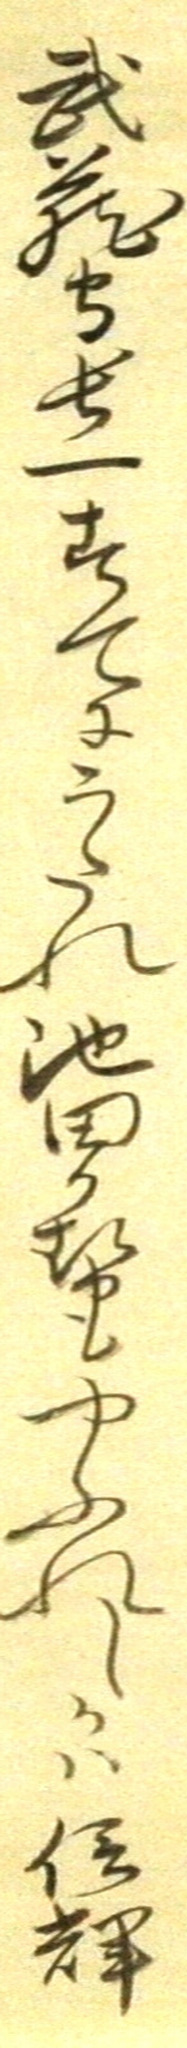武蔵守長一すてにうたれ池田か勢もやふれしかは信輝
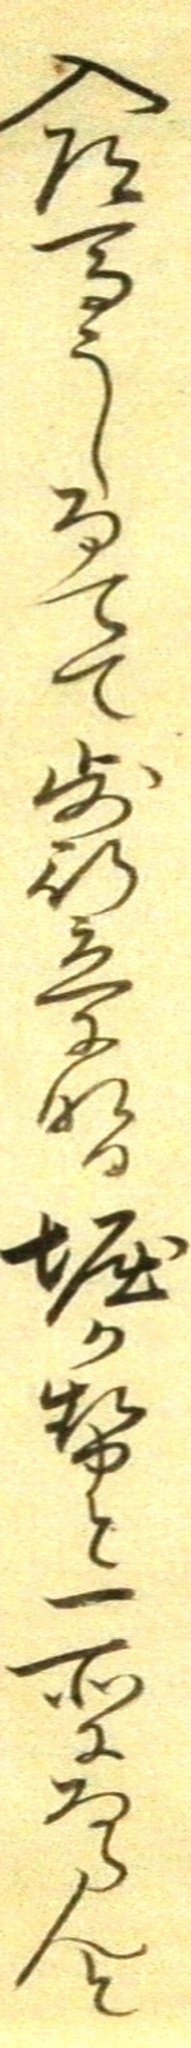入道馬うしなてて歩行立になる堀か勢と一所にならんと
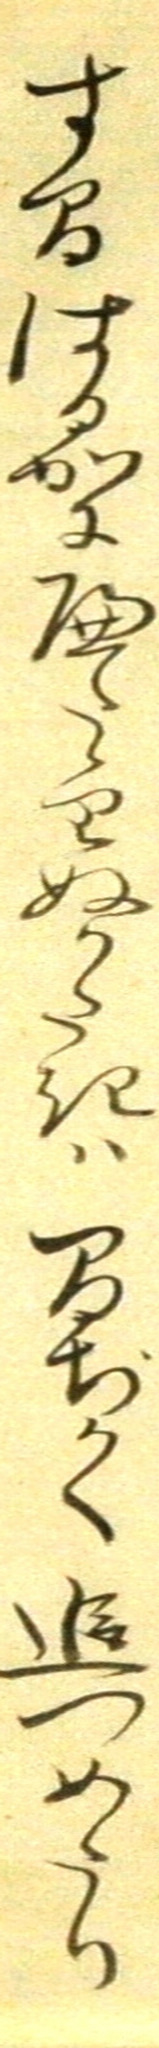す間はるかにへたゝりぬかたきは間ぢかく追つめたり
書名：藩翰譜（七・上）
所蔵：伊那市立高遠町図書館・合同会社AMANE
